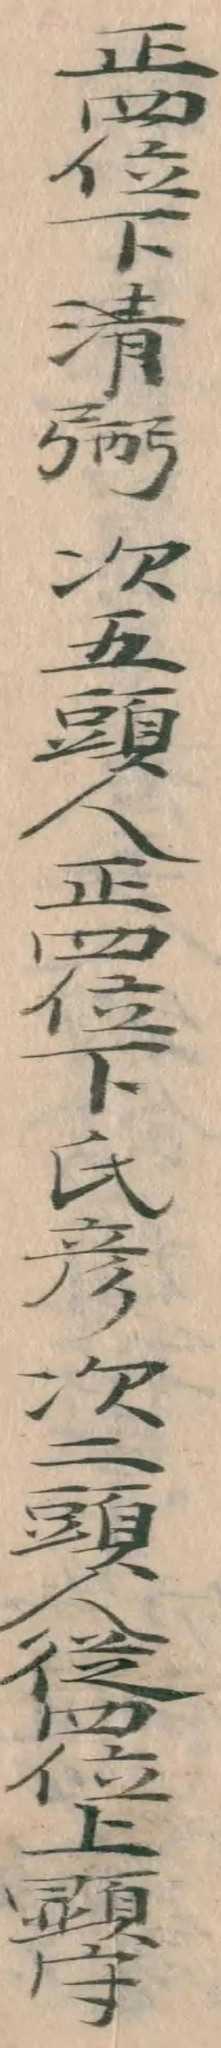正四位下清弼次五頭人正四位下氏彦次二頭人従四位上顕守
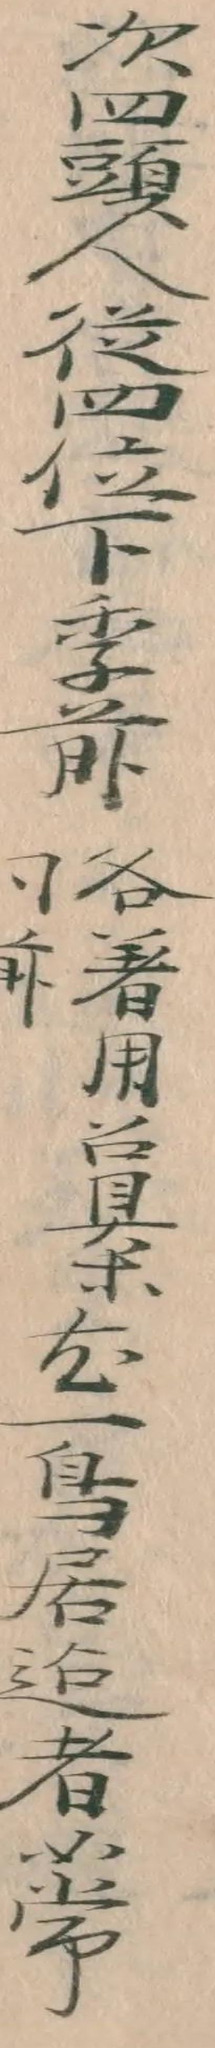次四頭人従四位下季前各着用召具等同前尤一鳥居迄は如常
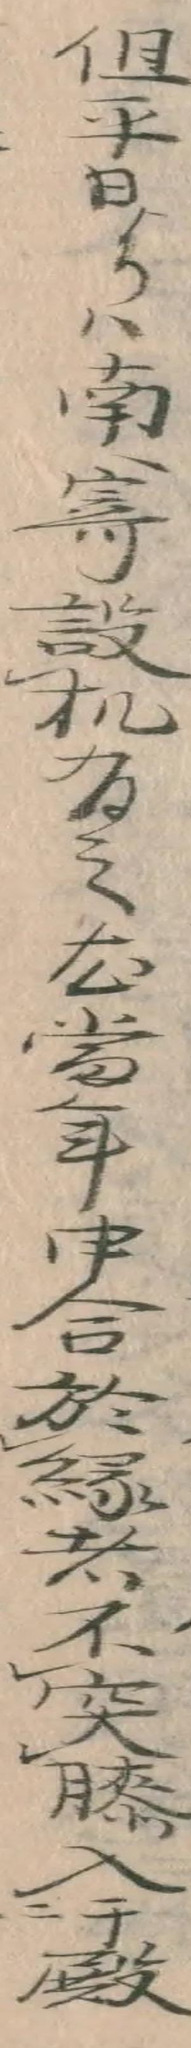但平日よりハ南へ寄設机有之尤當年申合於縁者不突膝入于殿
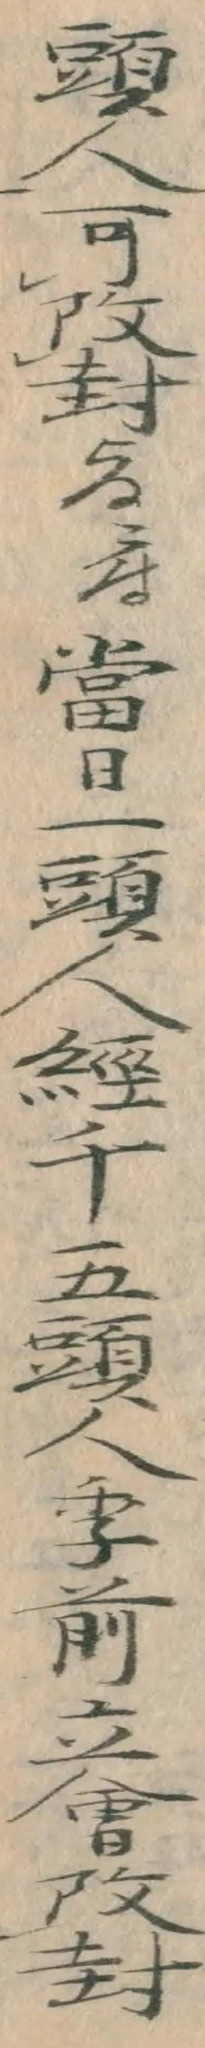頭人可改封旨ニ付當日一頭人経千五頭人季前立會改封

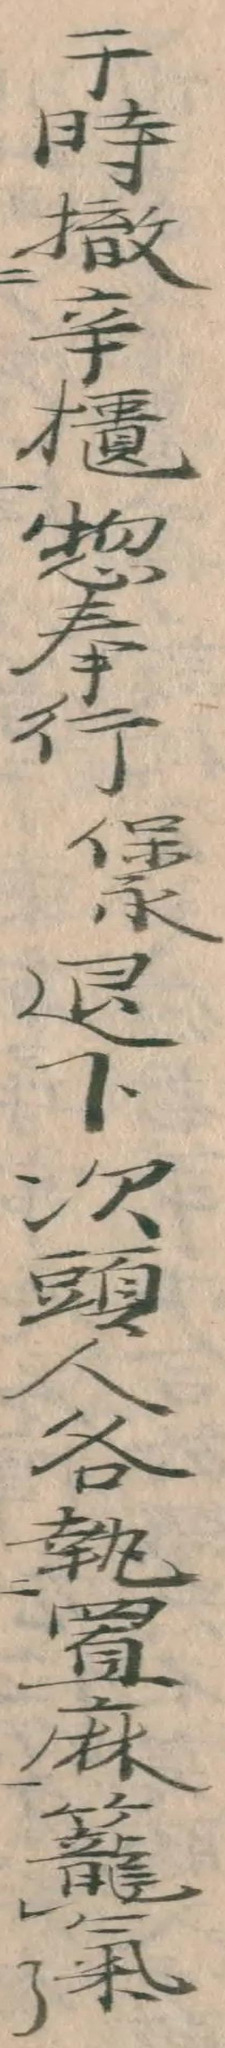于時撤辛櫃惣奉行保永退下次頭人各執置麻籠気了
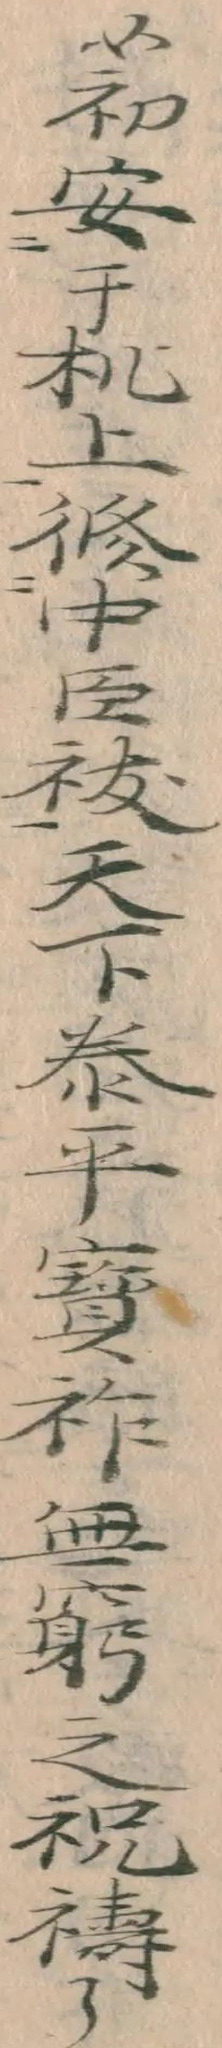如初安于机上修中臣祓天下泰平寶祚無窮之祝祷了
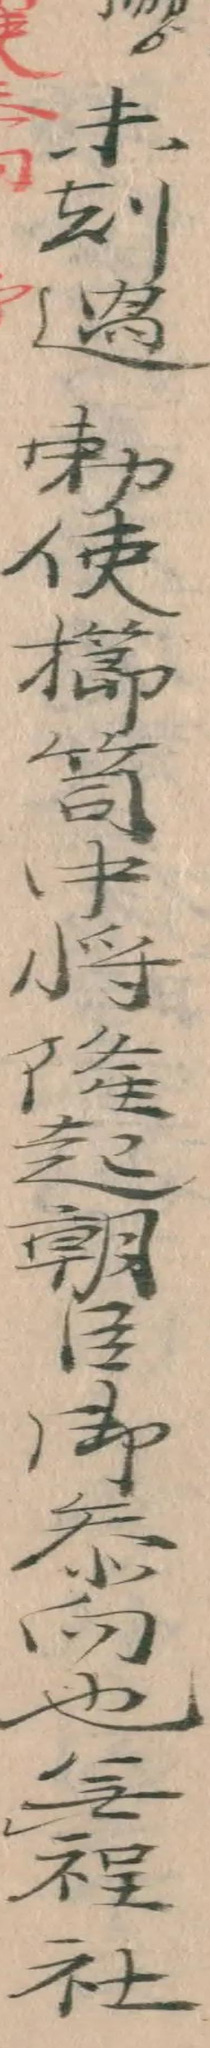未刻過勅使櫛笥中将隆起朝臣御参向也無程社
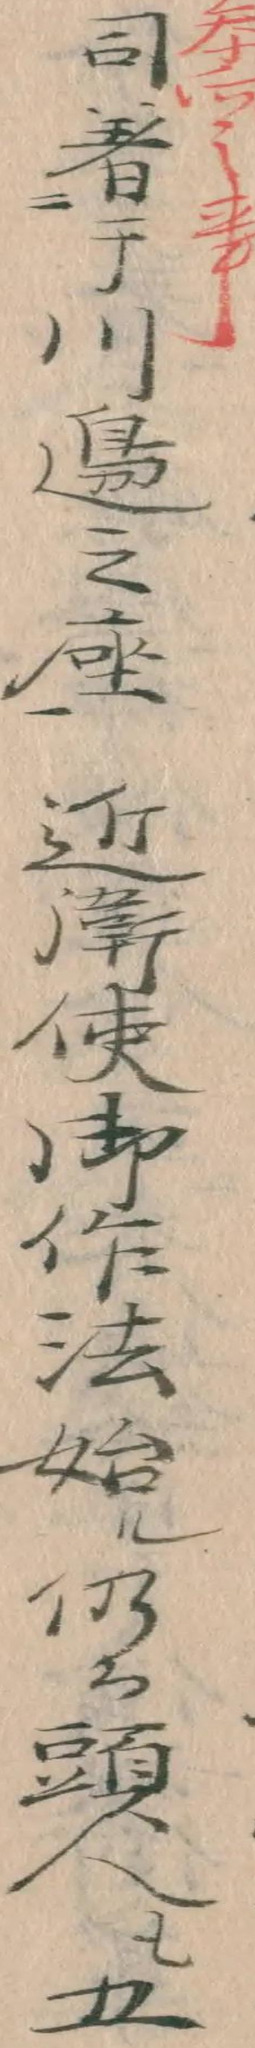司着于川邊之座近衛使御作法始ル仍而頭人も五
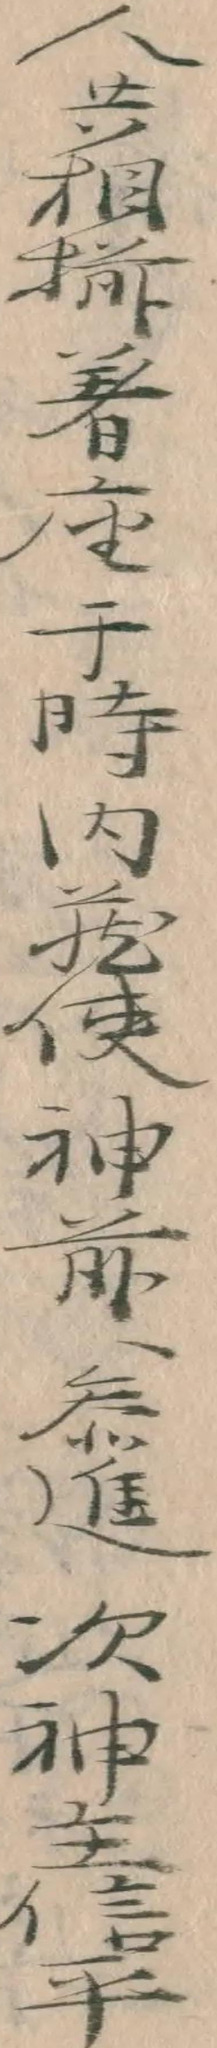人共相揃着座于時内蔵使神前へ参進次神主信平
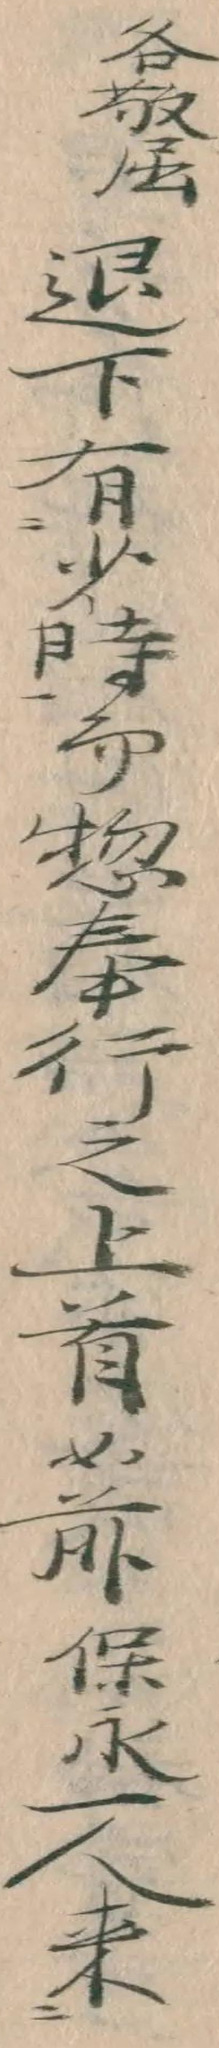各敬屈退下有二少時而惣奉行之上首如前保永一人来
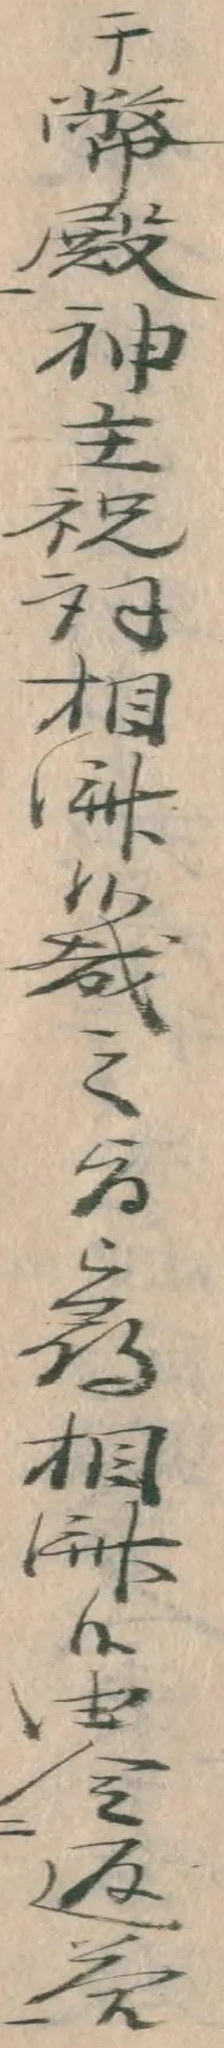于幣殿神主祝詞相済候哉之旨被尋相済申候由令返答
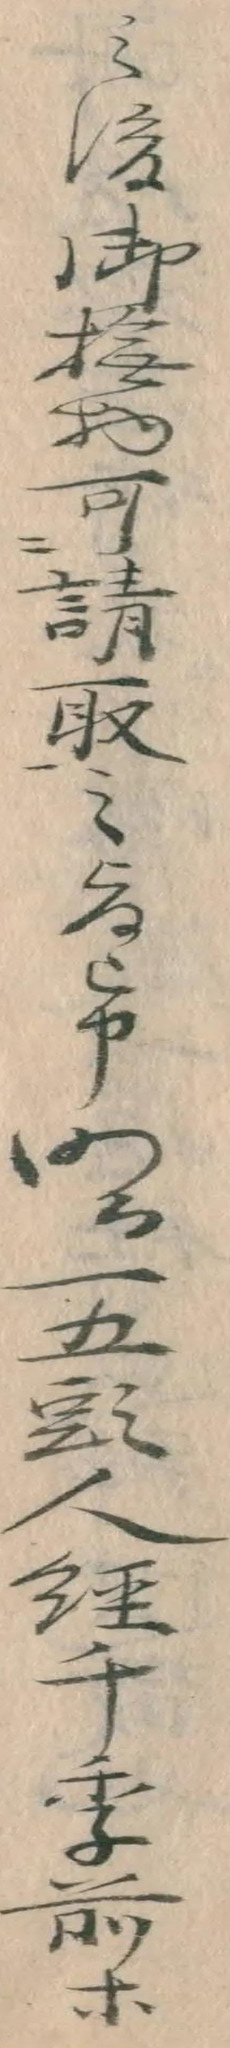之後御撫物可請取之旨被申仍而一五頭人経千季前等

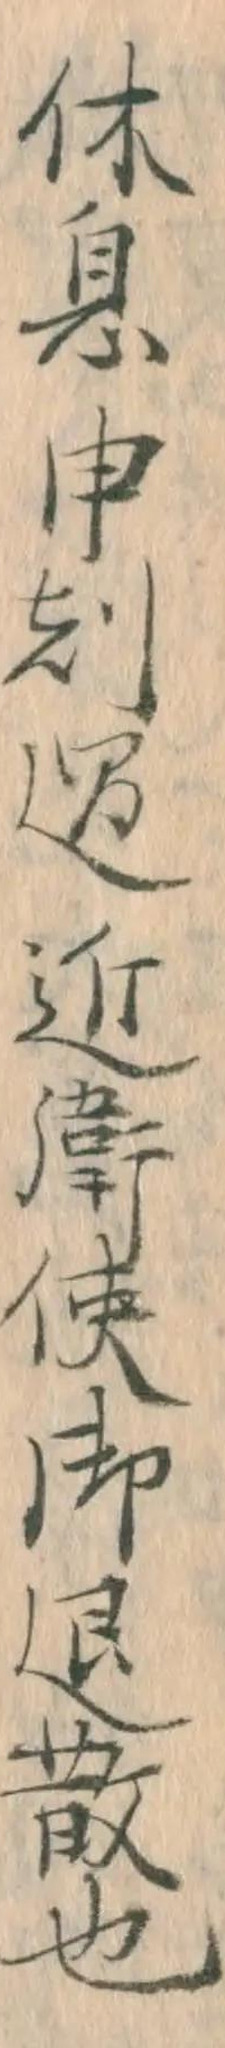休息申刻過近衛使御退散也
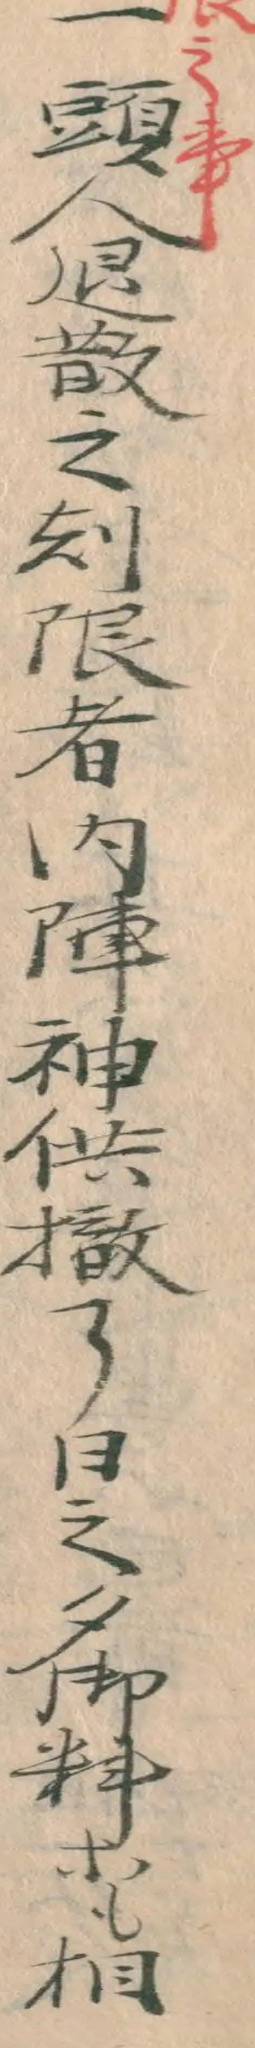一頭人退散之刻限者内陣神供撒了日之夕御料等も相
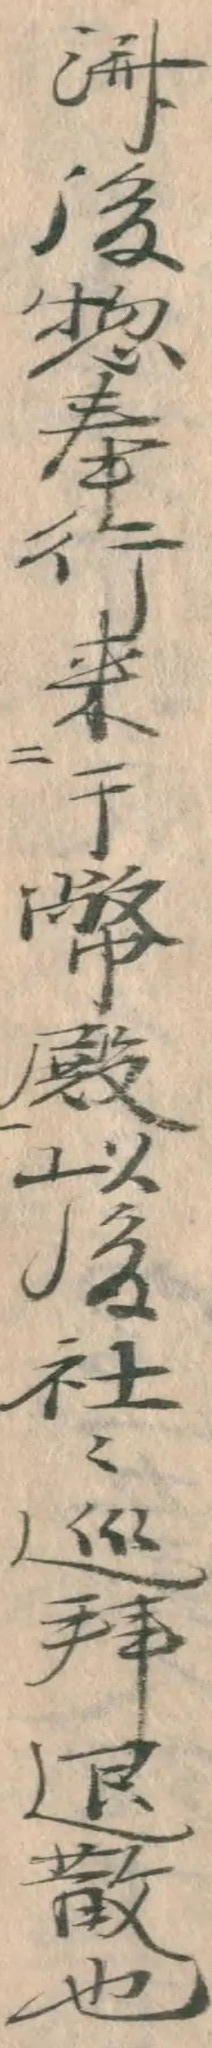済後惣奉行来于幣殿以後社々巡拝退散也
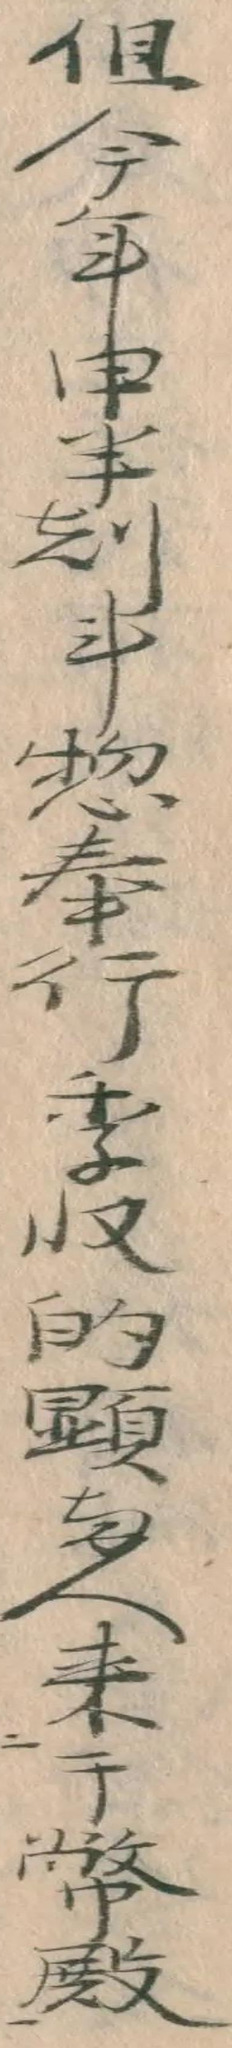但今年甲半刻斗惣奉行季収的顕両人来于幣殿
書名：賀茂社記録. 第73冊
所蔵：国立国会図書館 National Diet Library, JAPAN
